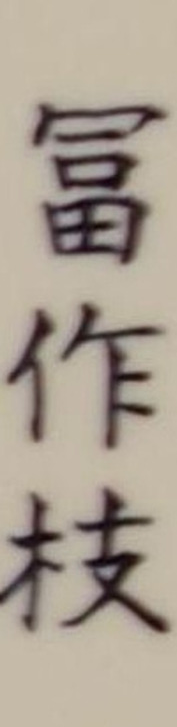冨作枝
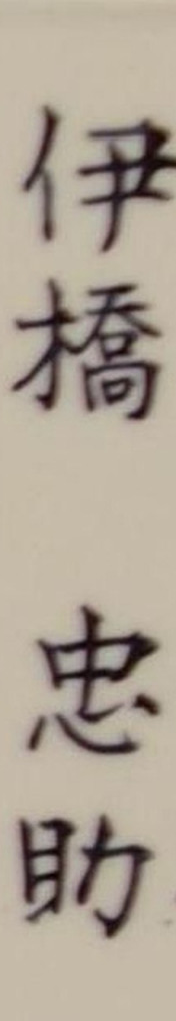伊橋忠助
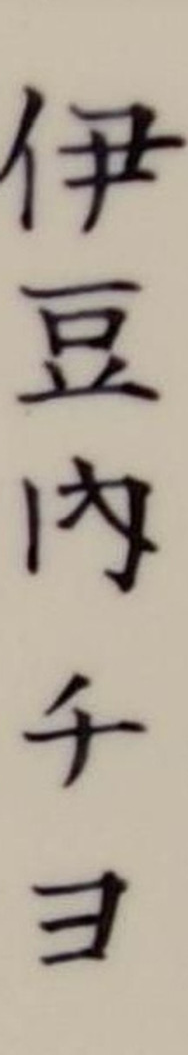伊豆内チヨ
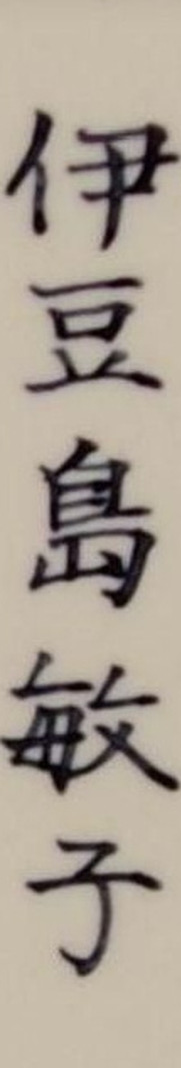伊豆島敏子
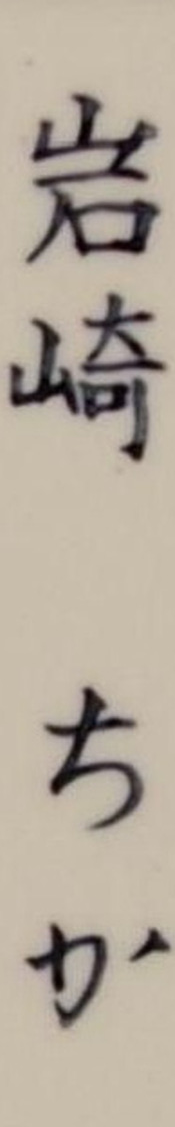岩崎ちか
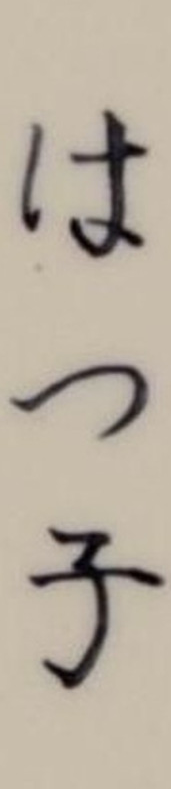はつ子
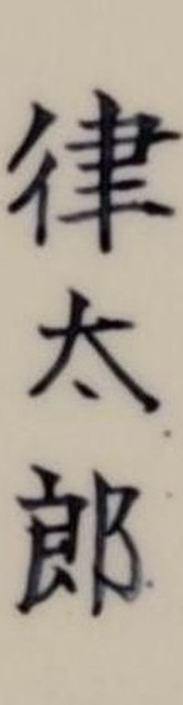津太郎

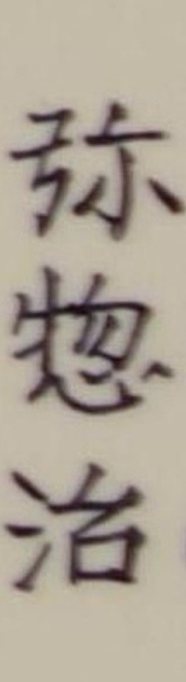弥惣治
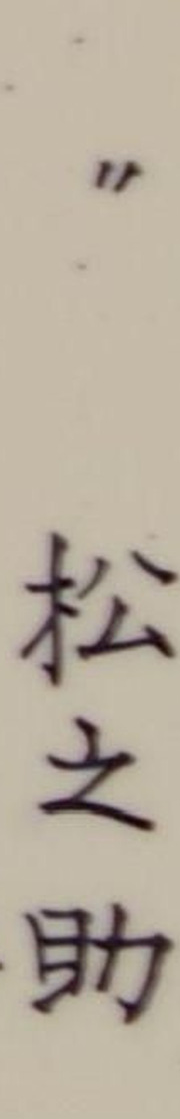松之助
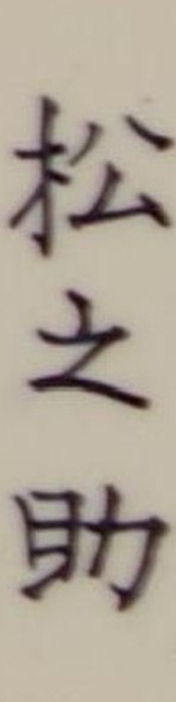松之助
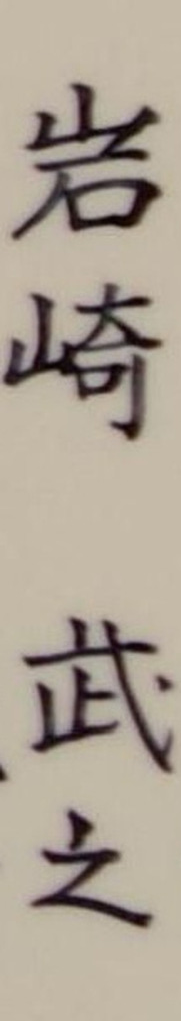岩崎武之
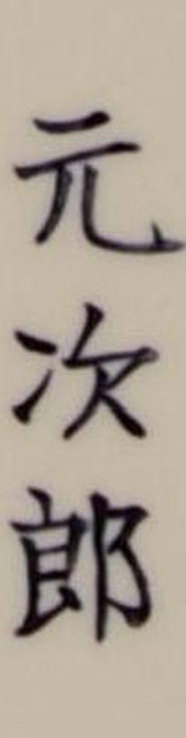元次郎
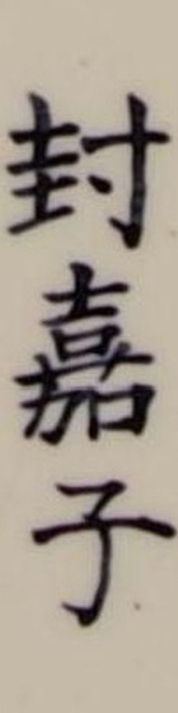封嘉子
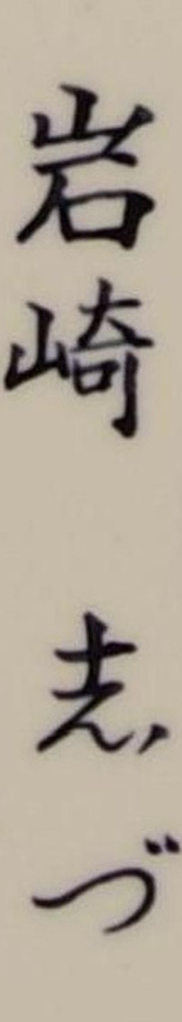岩崎しづ
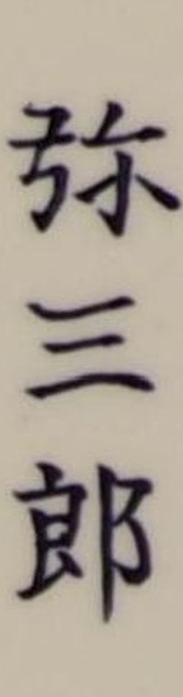弥三郎
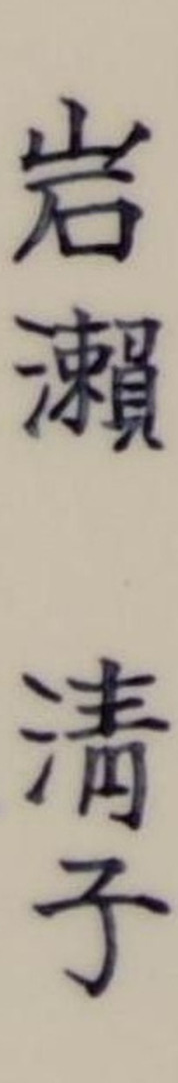岩瀬清子
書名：M~S
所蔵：高野山金剛峯寺
